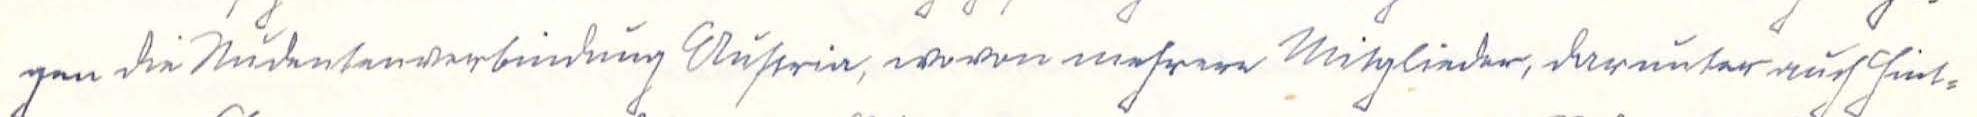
gen die Studentenverbindung Austria, wovon mehrere Mitglieder, darunter auch Hint-
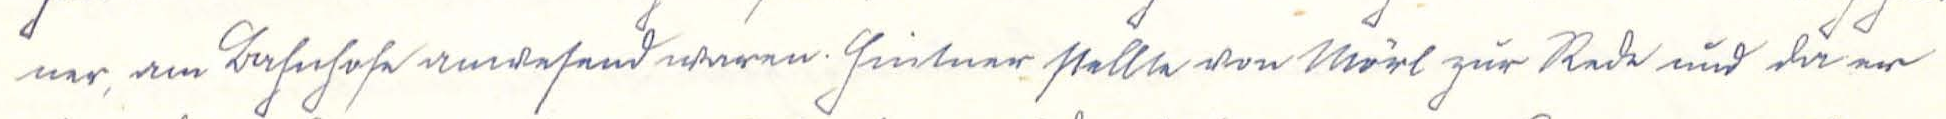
ner am Bahnhofe anwesend waren. Hintner stellte von Mörl zur Rede und da er
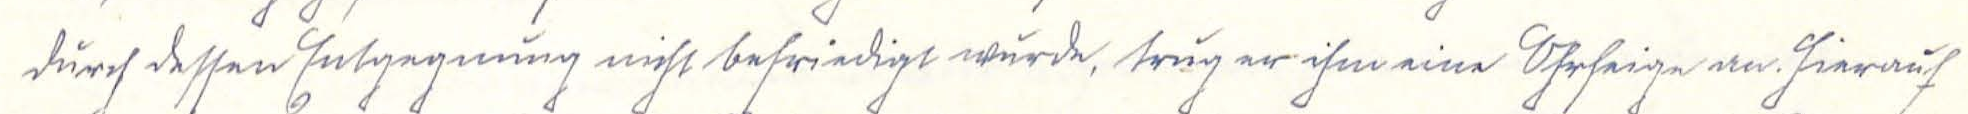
durch dessen Entgegnung nicht befriedigt wurde, trug er ihm eine Ohrfeige an. Hierauf
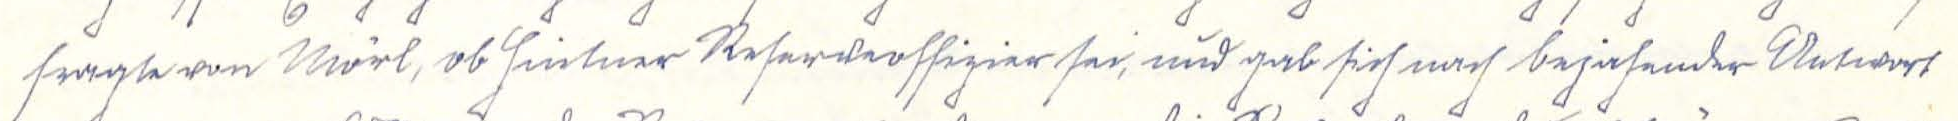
fragte von Mörl, ob Hintner Reserveoffizier sei und gab sich nach bejahender Antwort
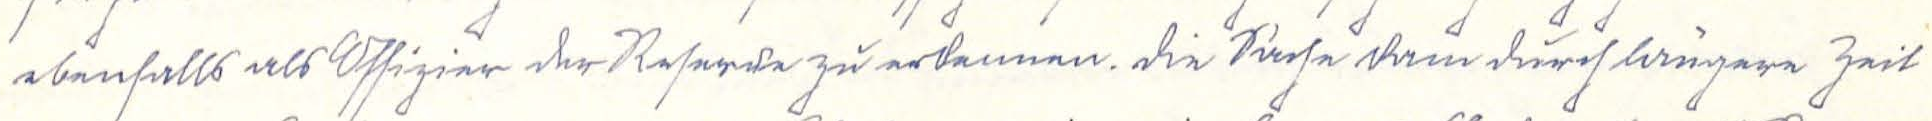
ebenfalls als Offizier der Reserve zu erkennen. Die Sache kam durch längere Zeit
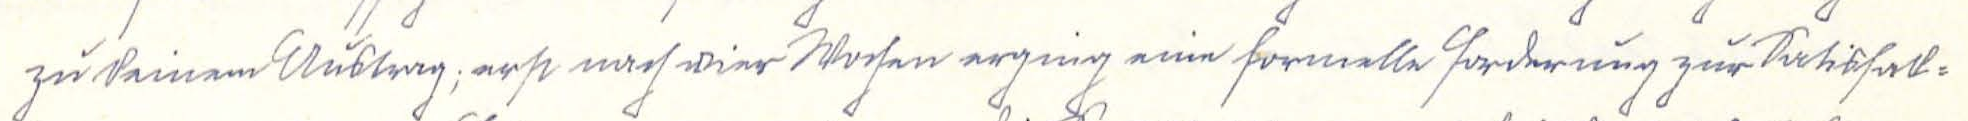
zu keinem Austrag, erst nach vier Wochen erging eine formelle Forderung zu Satisfak-
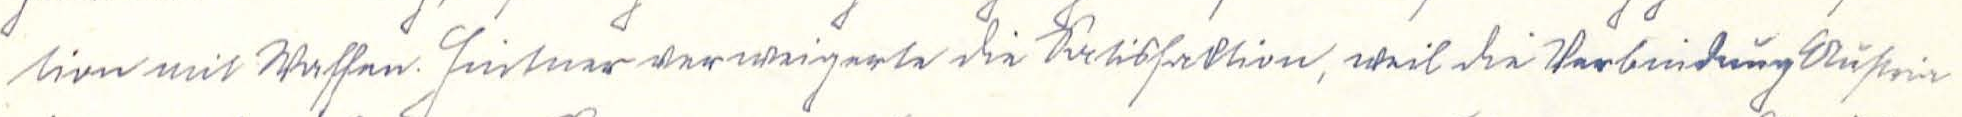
tiuon mit Waffen. Hintner verweigerte die Satisfaktion, weil die Verbindung Austria
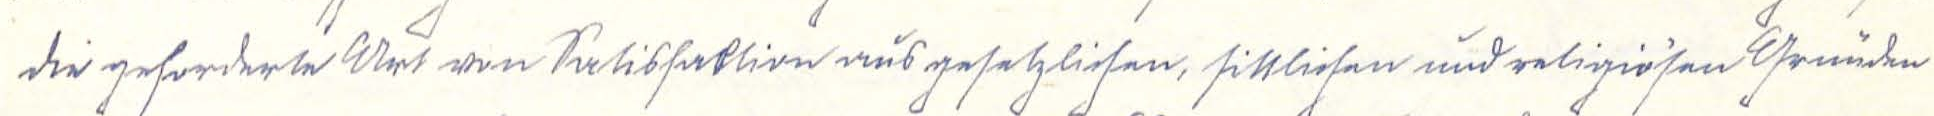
die geforderte Art von Satisfaktion aus gesetzlichen, sittlichen und religiösen Gründen
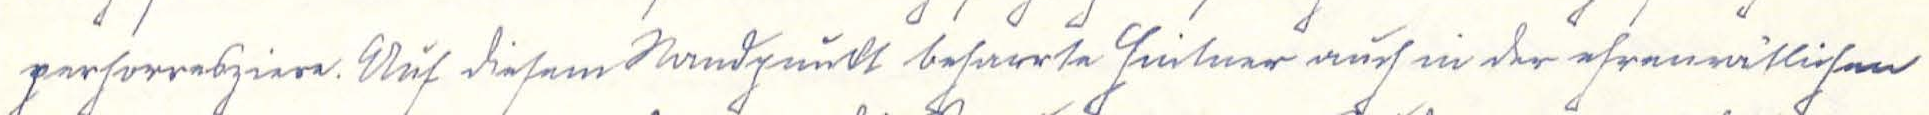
perhorresziere. Auf diesem Standpunkt beharrte Hintner auch in der ehrenrätlichen
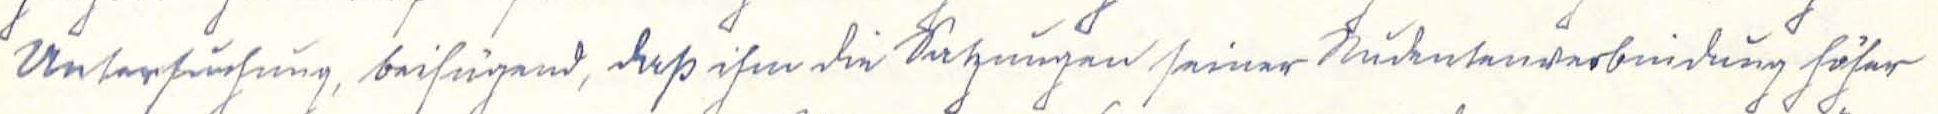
Untersuchung, beifügend, daß ihm die Satzungen seiner Studentenverbindung höher-
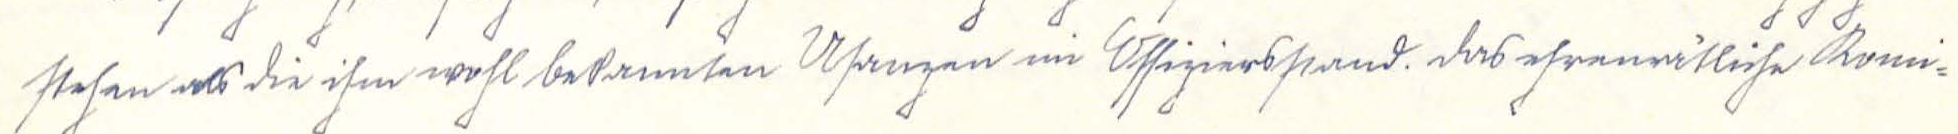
stehen als die ihm wohl bekannten Usanzen im Offiziersstand. Das ehrenrätliche Komi-
